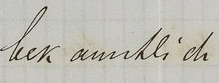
bekanntlich
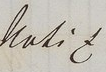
sehr gut
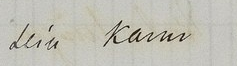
sein kann
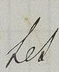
steht
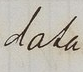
aber
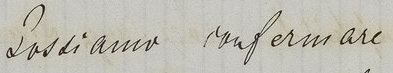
Possiamo confermare
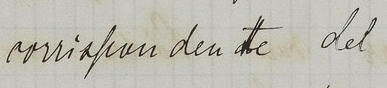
corrispondente del Corriere
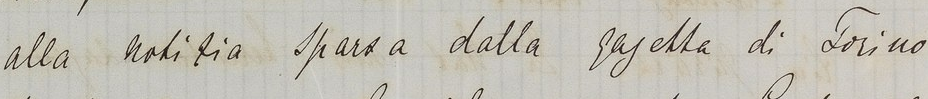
alla notizia sparsa dalla Gazetta di Torino
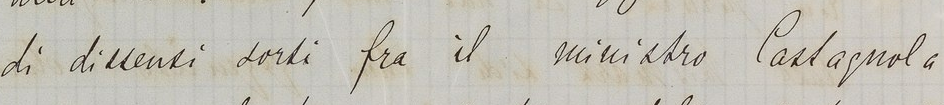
di dissenti sorti fra il ministro Castagnola
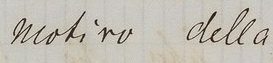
motivo dell nota
